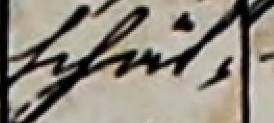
eschät„
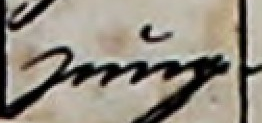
zung
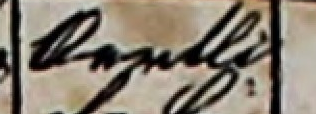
Oertli„
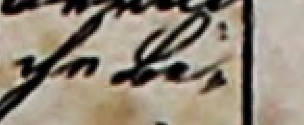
che B
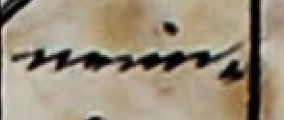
en???„
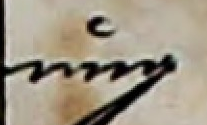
ung
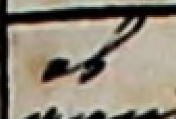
ob
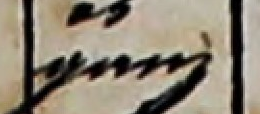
ganz
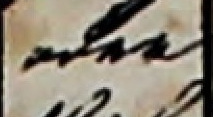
wer
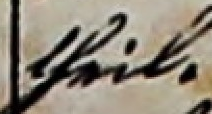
theil.
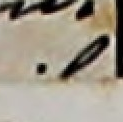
weise
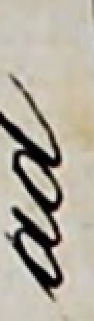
ad
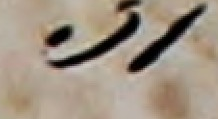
51
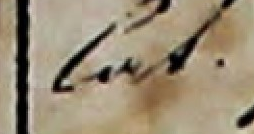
Cat.
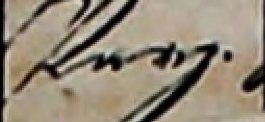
Perg.
